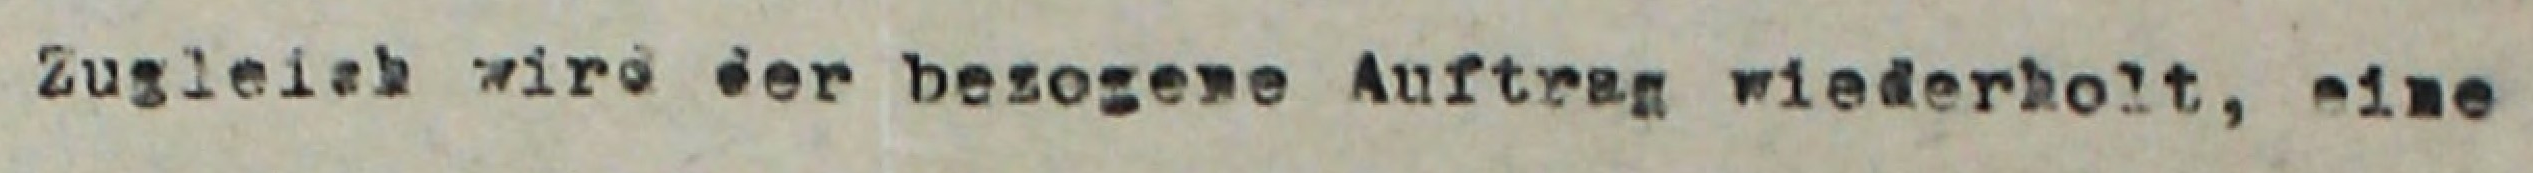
Zugleich wird der bezogene Auftrag wiederholt, eine
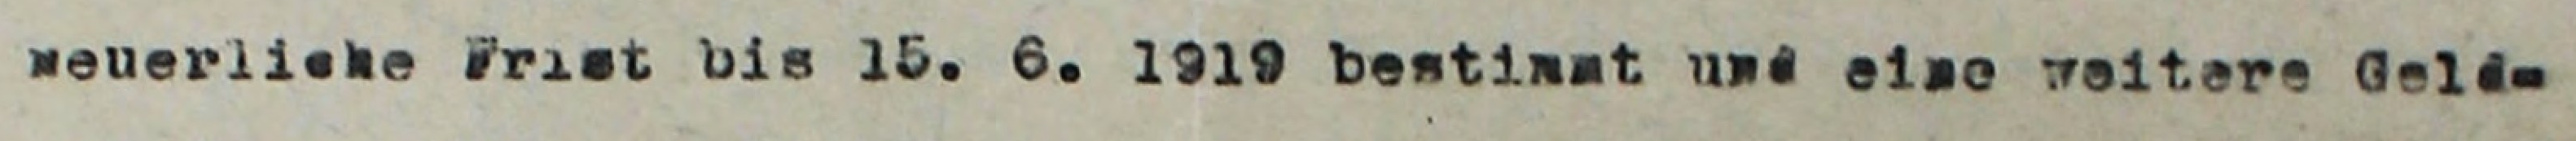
neuerliche Frist bis 15. 6. 1919 bestimmt und eine weitere Geld¬
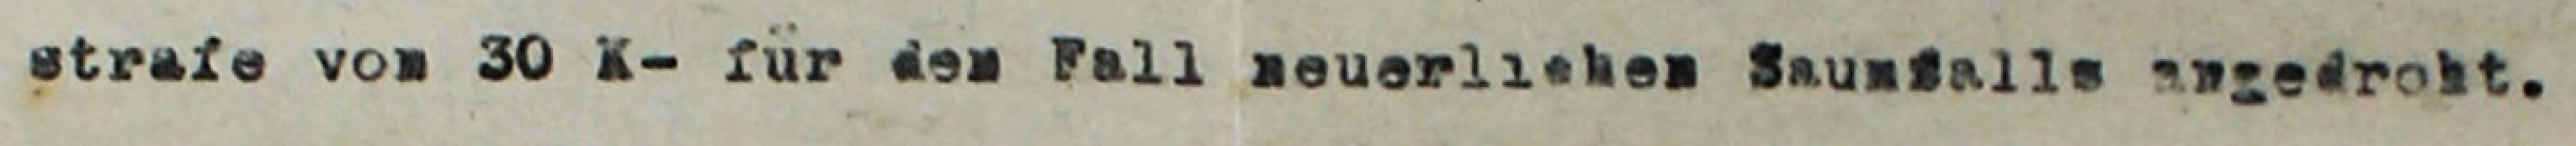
strafe von 30 K- für den Fall neuerlichen Saumsalls angedroht.
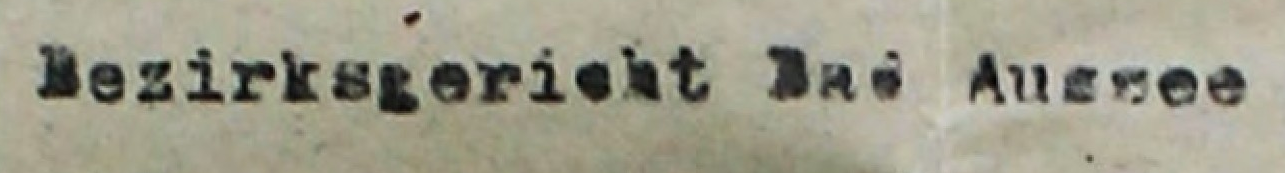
Bezirksgericht Bad Aussee
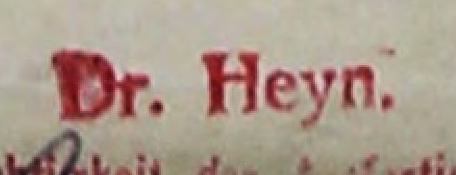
Dr. Heyn.
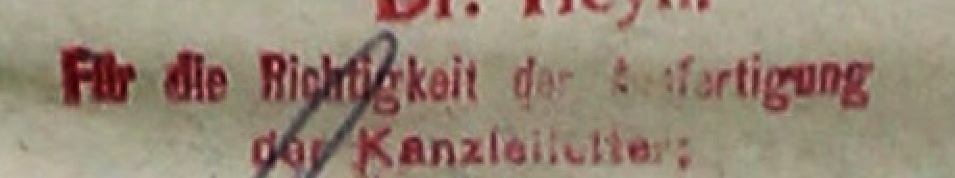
Für die Richtigkeit der Ausfertigung
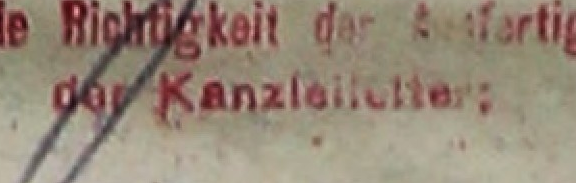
der Kanzleileiter:
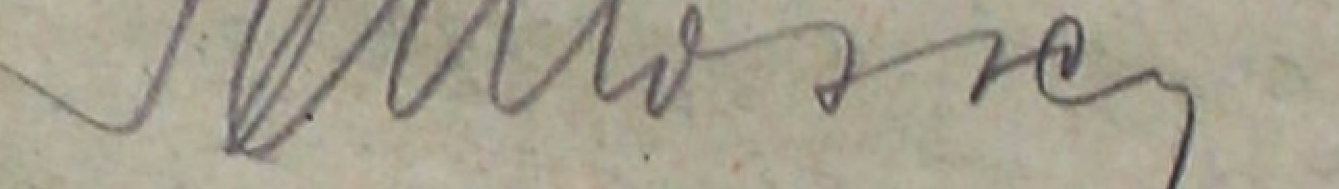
Schlossen
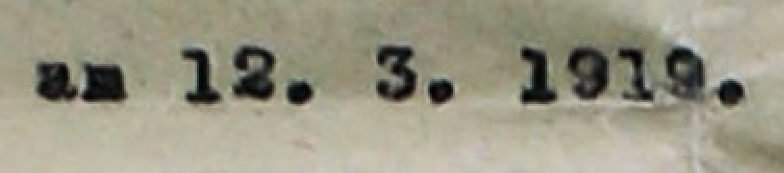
am 12. 3. 1919.
